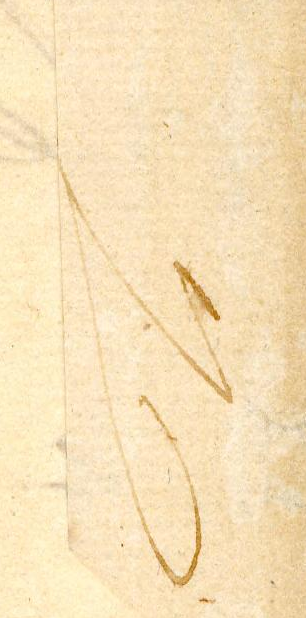To
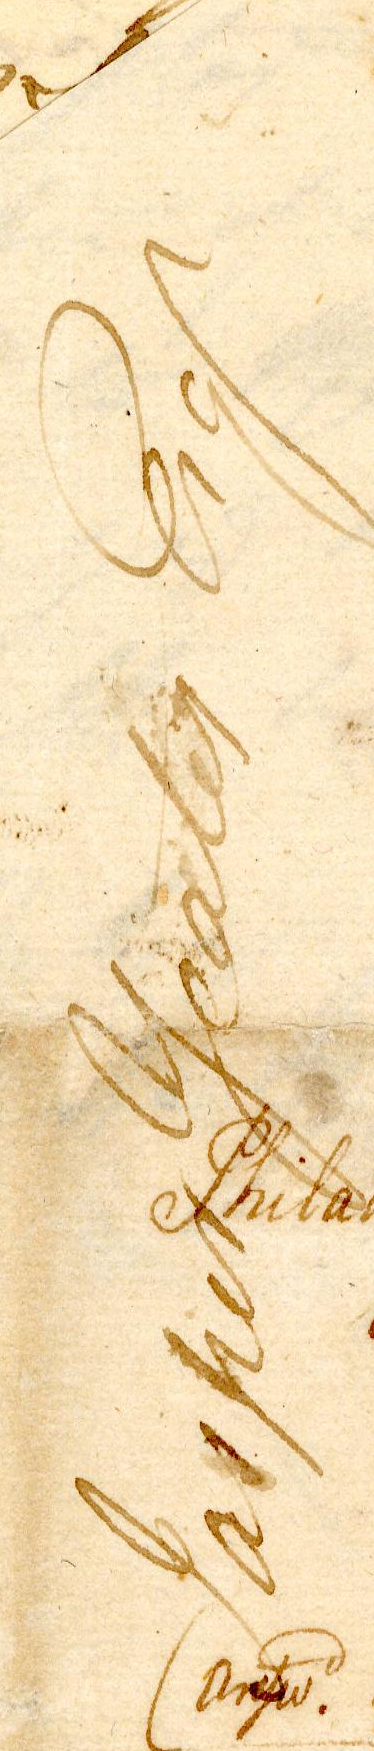Jasper Yeates Esq
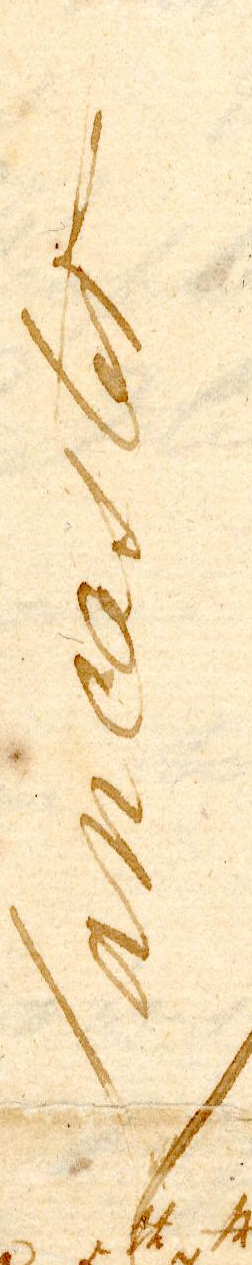Lancaster
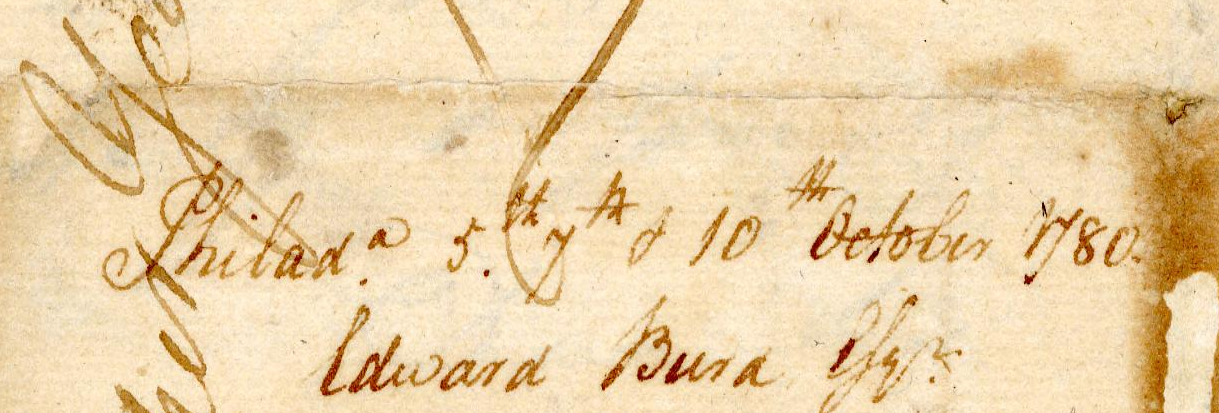Philad^a. 5^th 7^th & 10^th October 1780
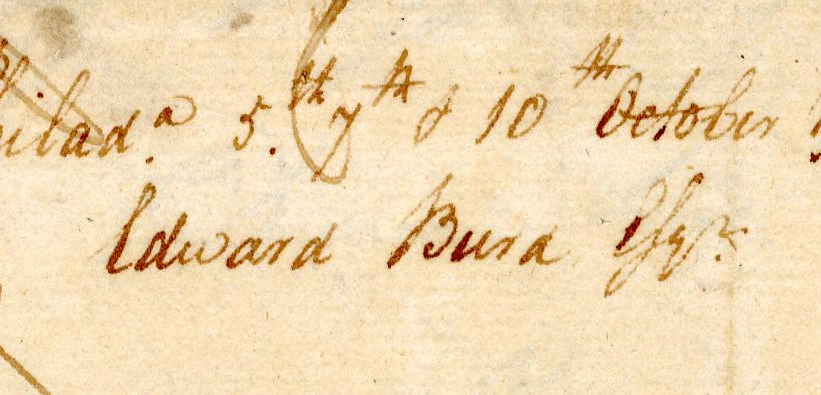Edward Burd Esq^r.
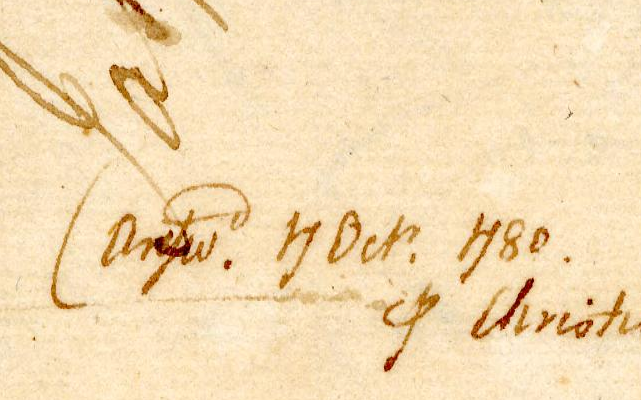Answ^d. 17 Oct. 1780
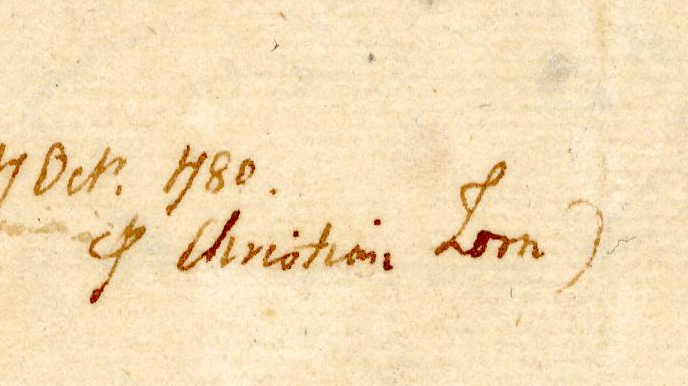Per Christian Loon
